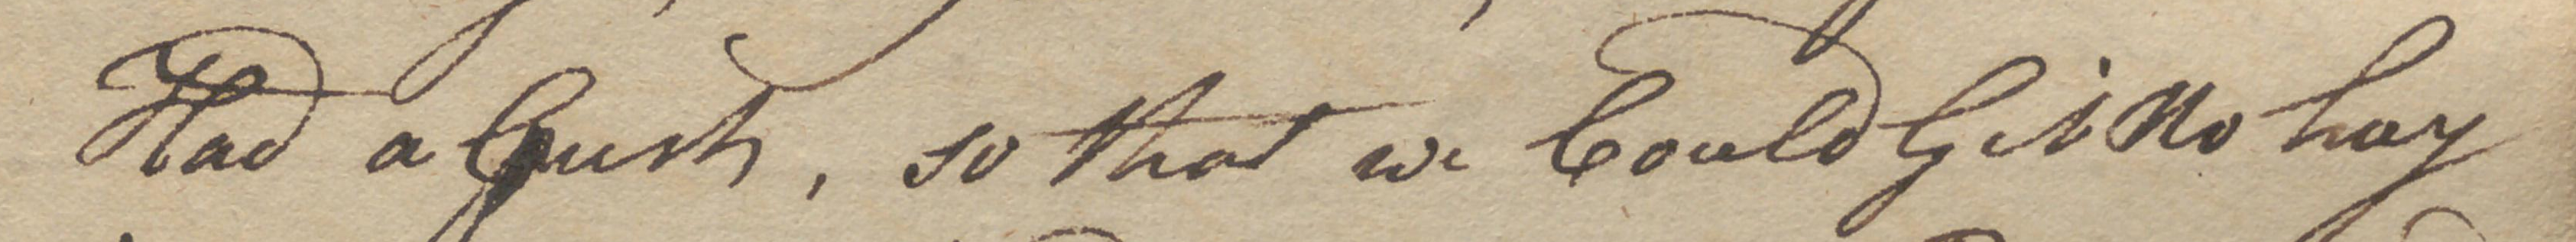Had a Gust, so that we Could Git No hay
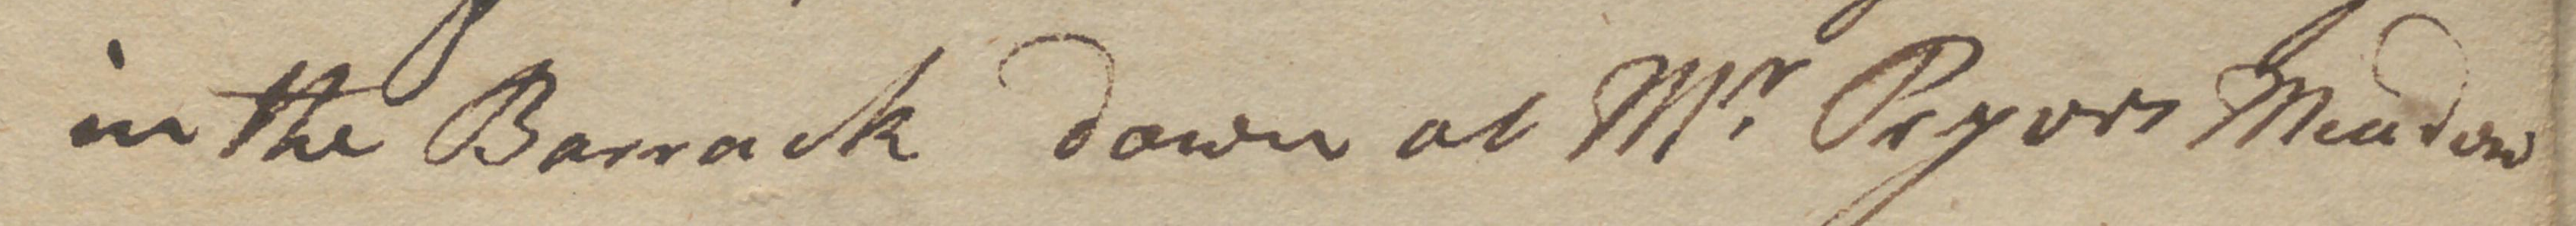in the Barrack down at M^r. Pryors Meadow
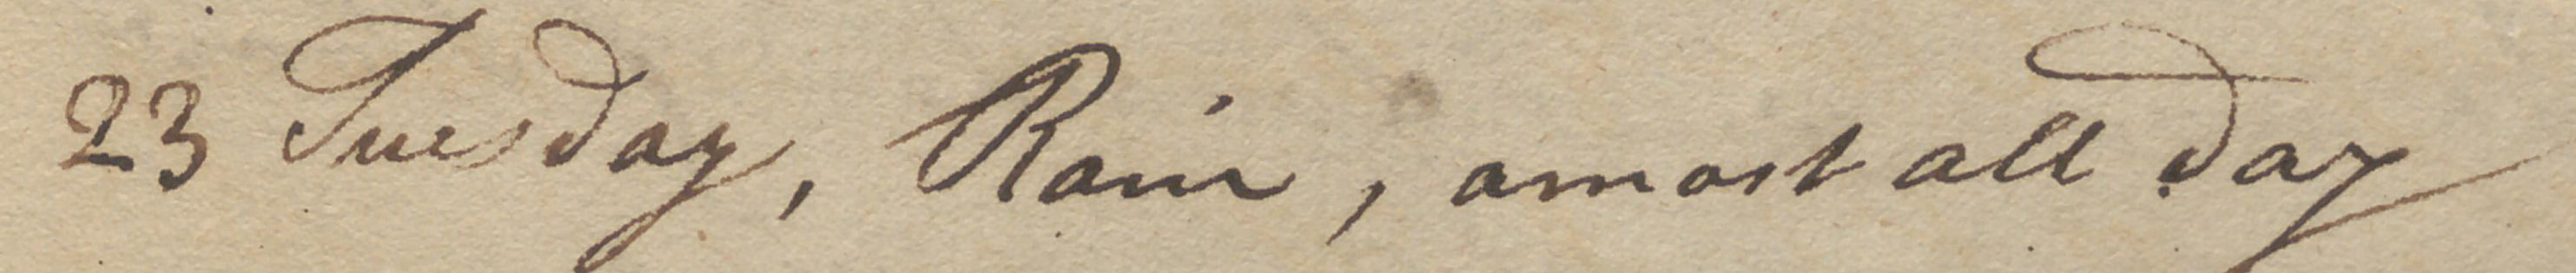23 Tuesday, Rain, amost all day
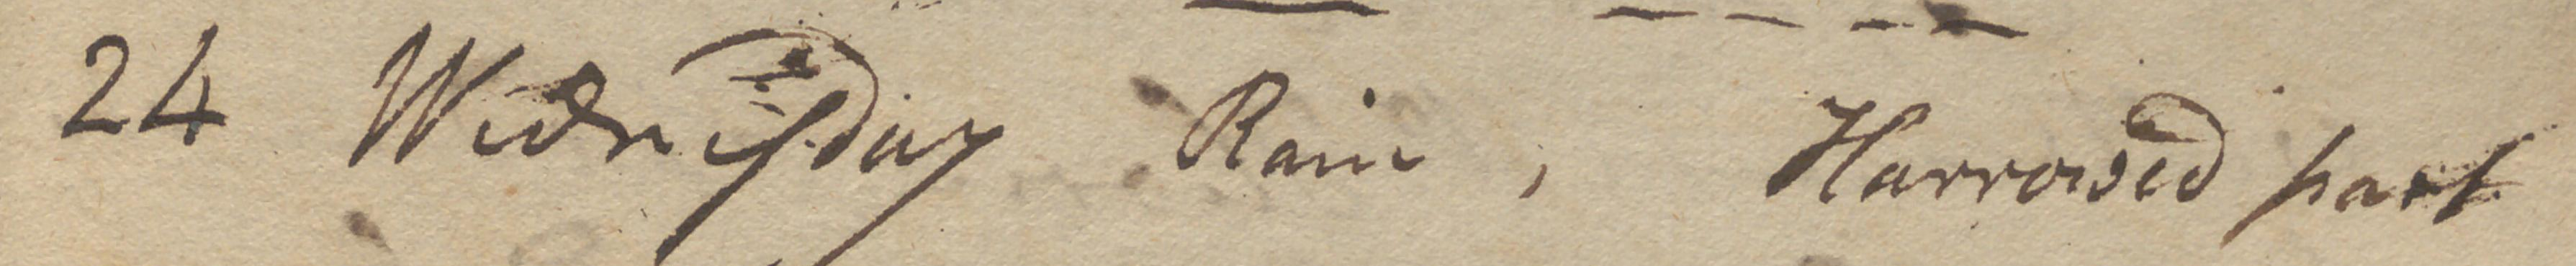24 Wednisday Rain, Harrowed part
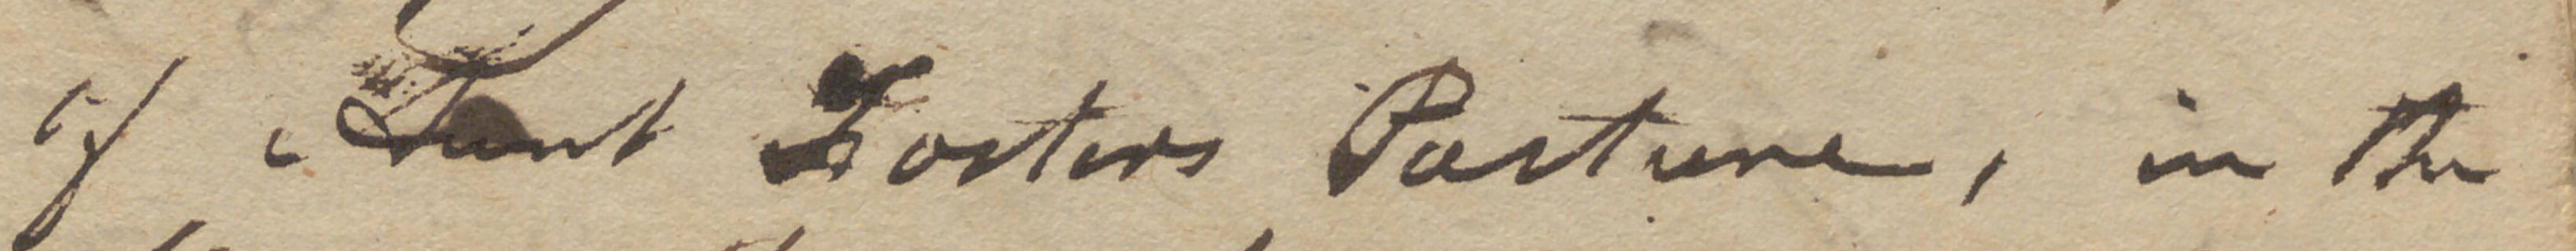of Aunt Fosters Pasture, in the
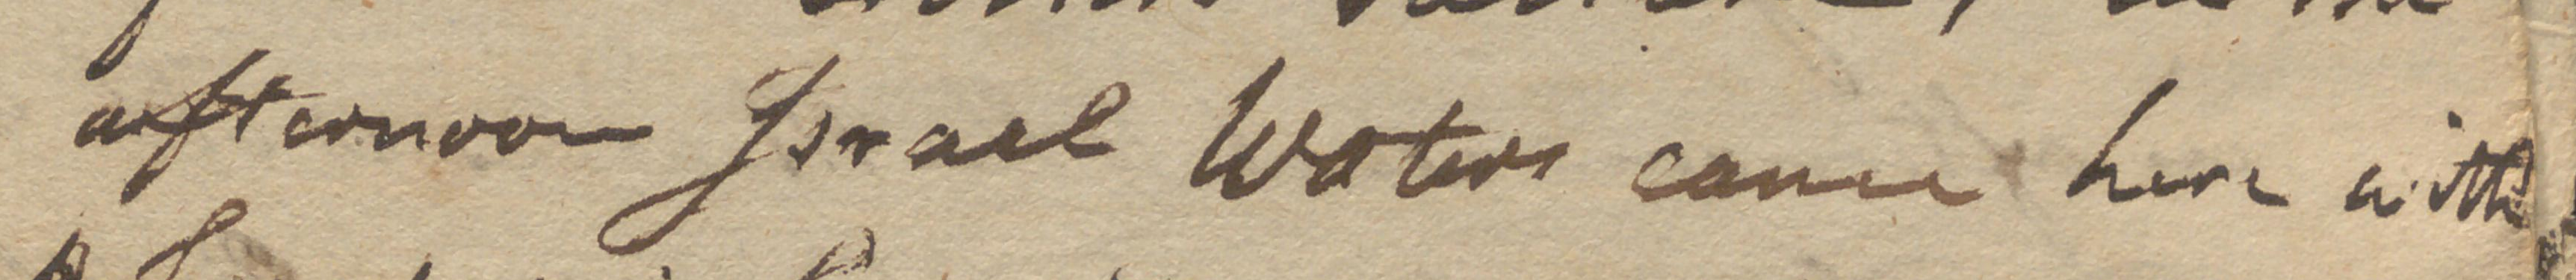afternoon Israel Waters came here with
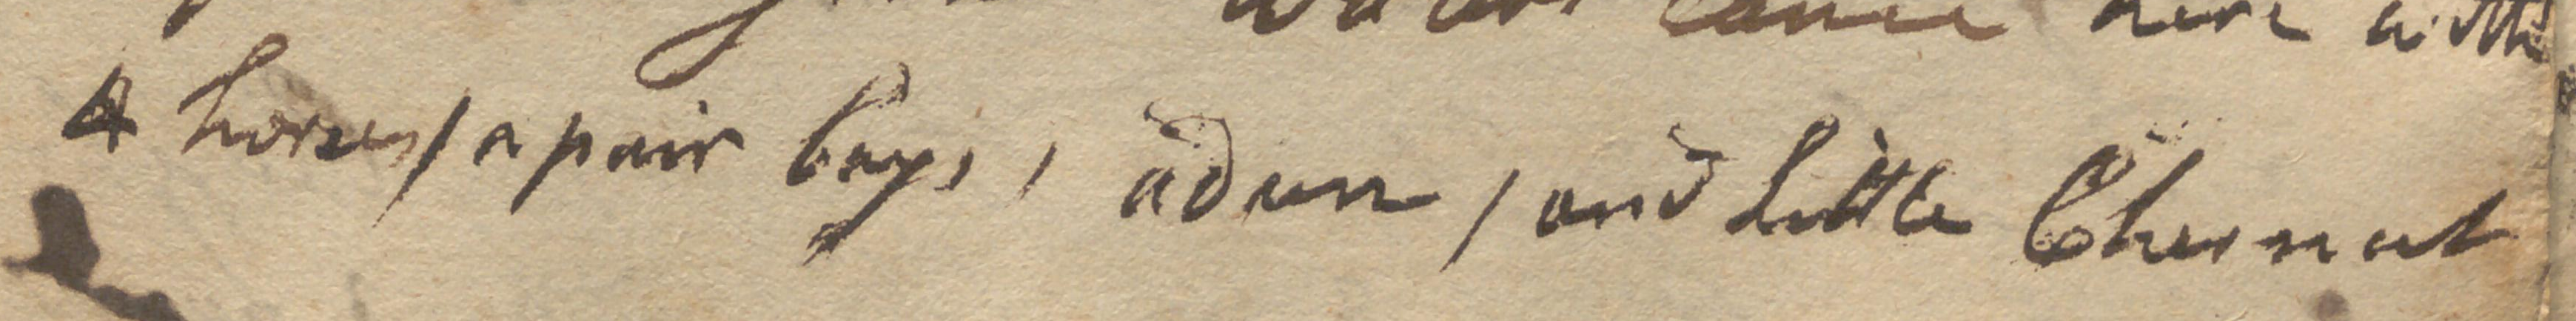4 horses, a pair bays, a dun, and Little Chernet
